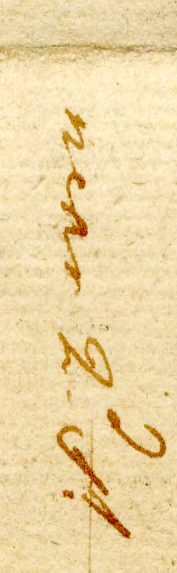near 2.^d s^t.
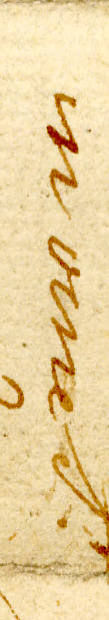in vine S^t.
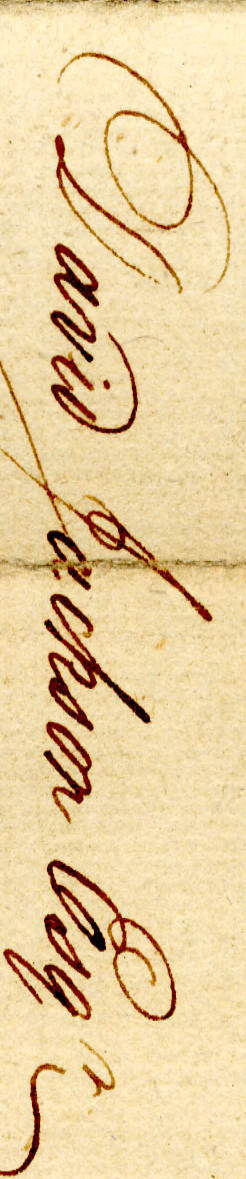David Jackson Esq^r
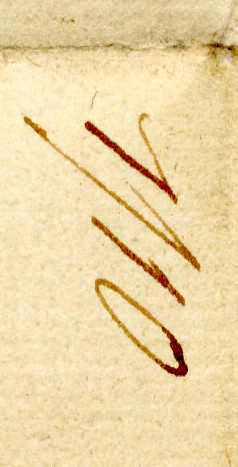1/10
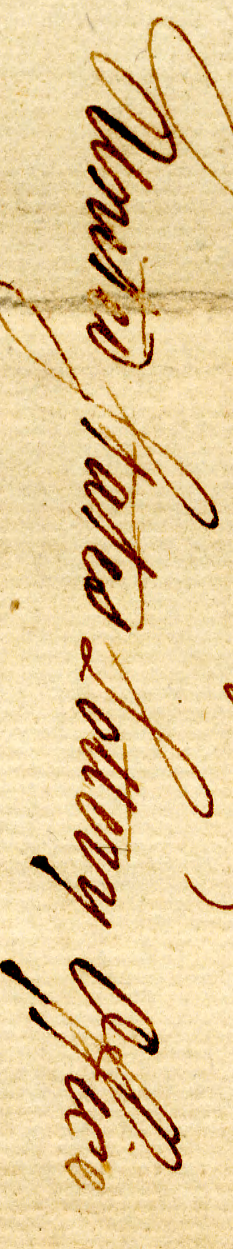United States Lottery Office
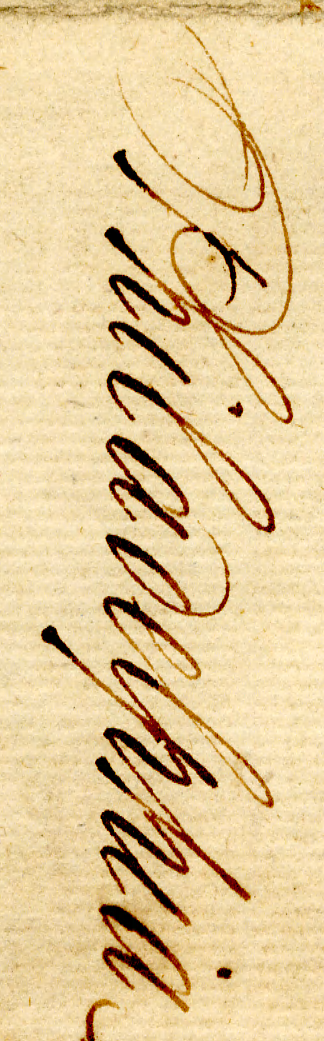Philadelphia
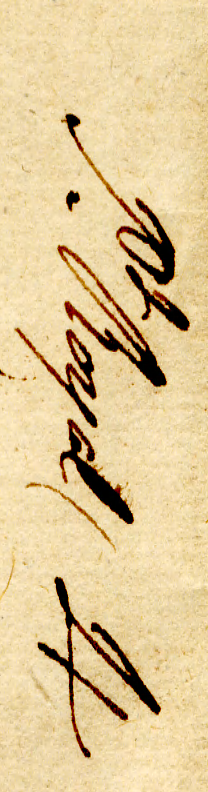P.^t Royal 4
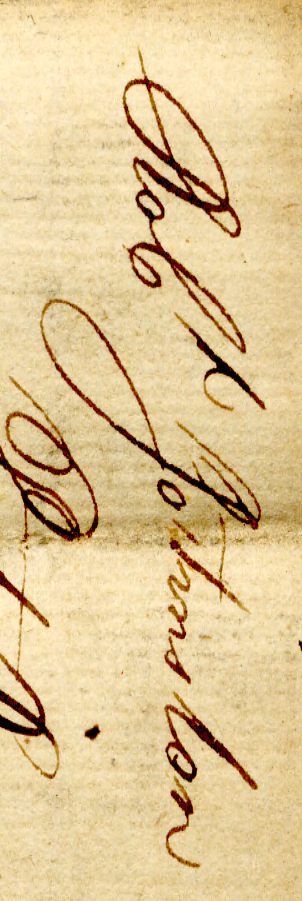Rob^t Johnston
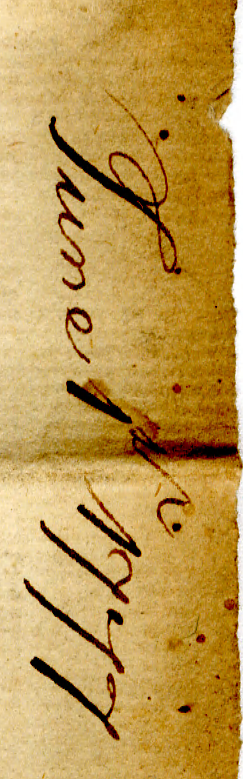June 1^st 1777
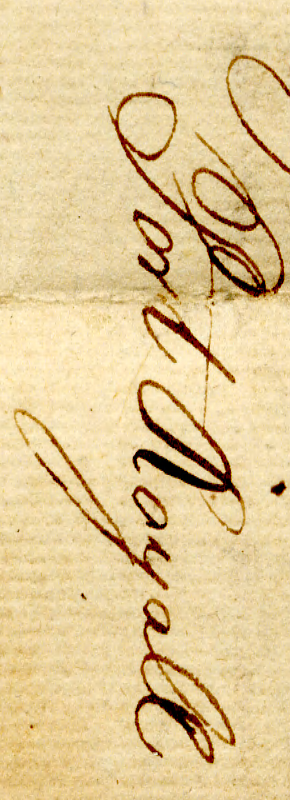Port Royall
